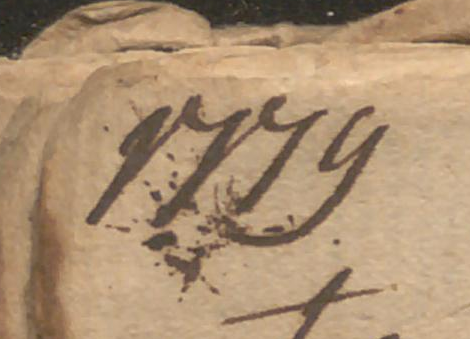1779
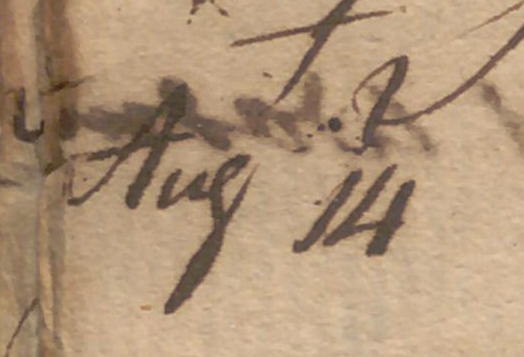Aug 14
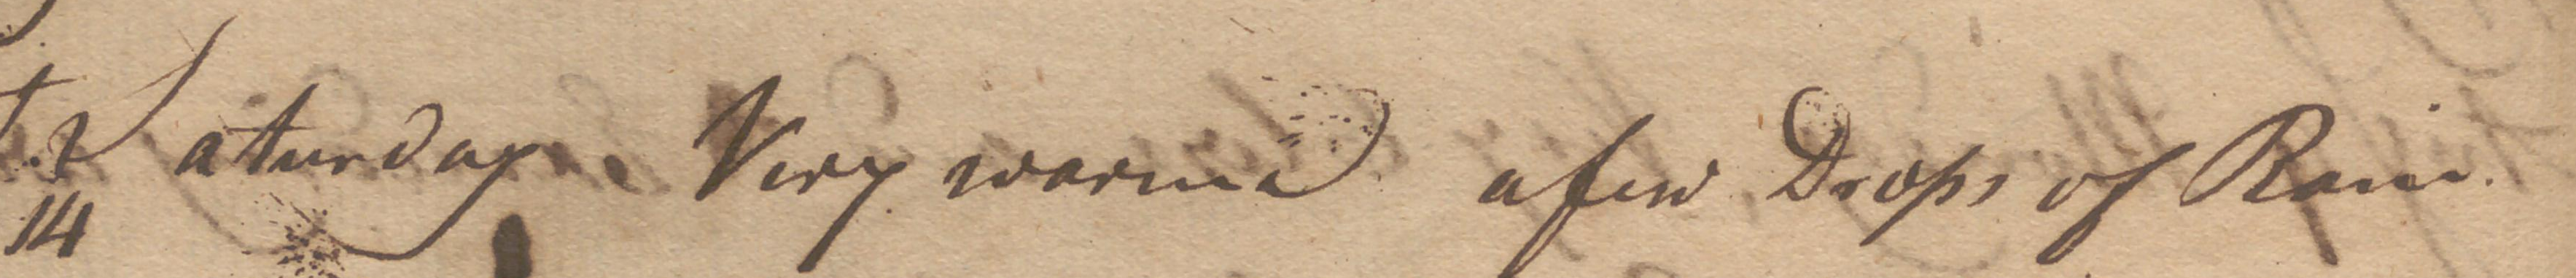Saturday Very warme a few Drops of Rain
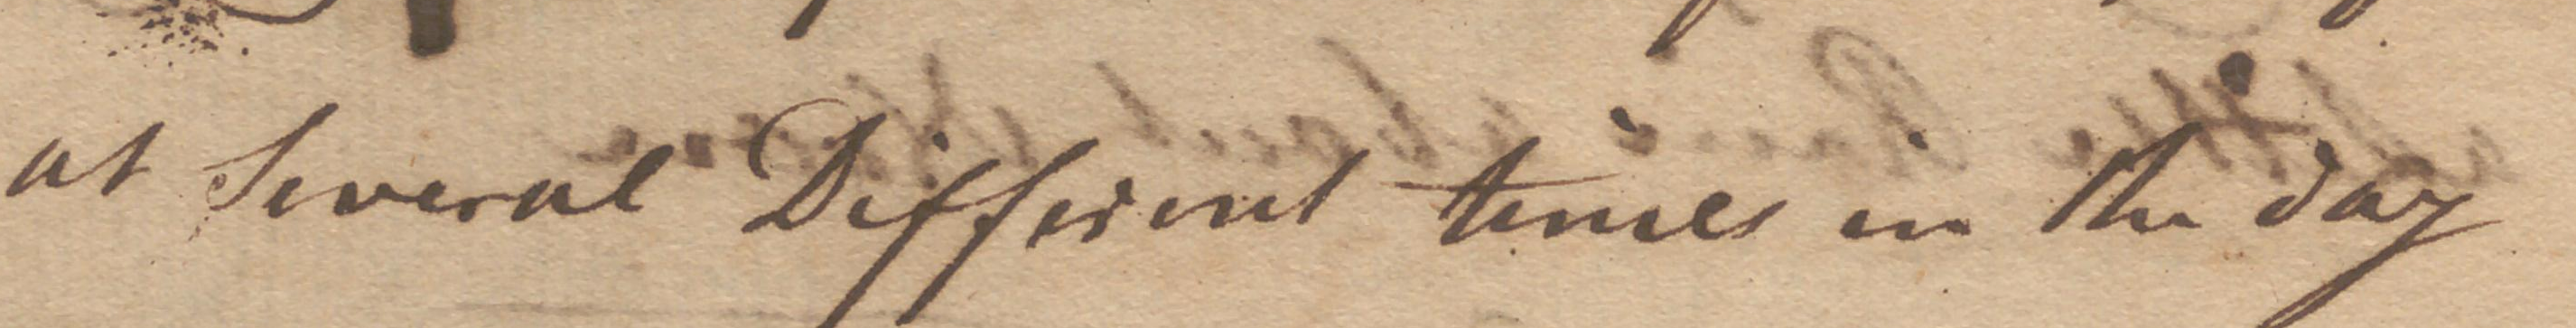at Several Different times in the day
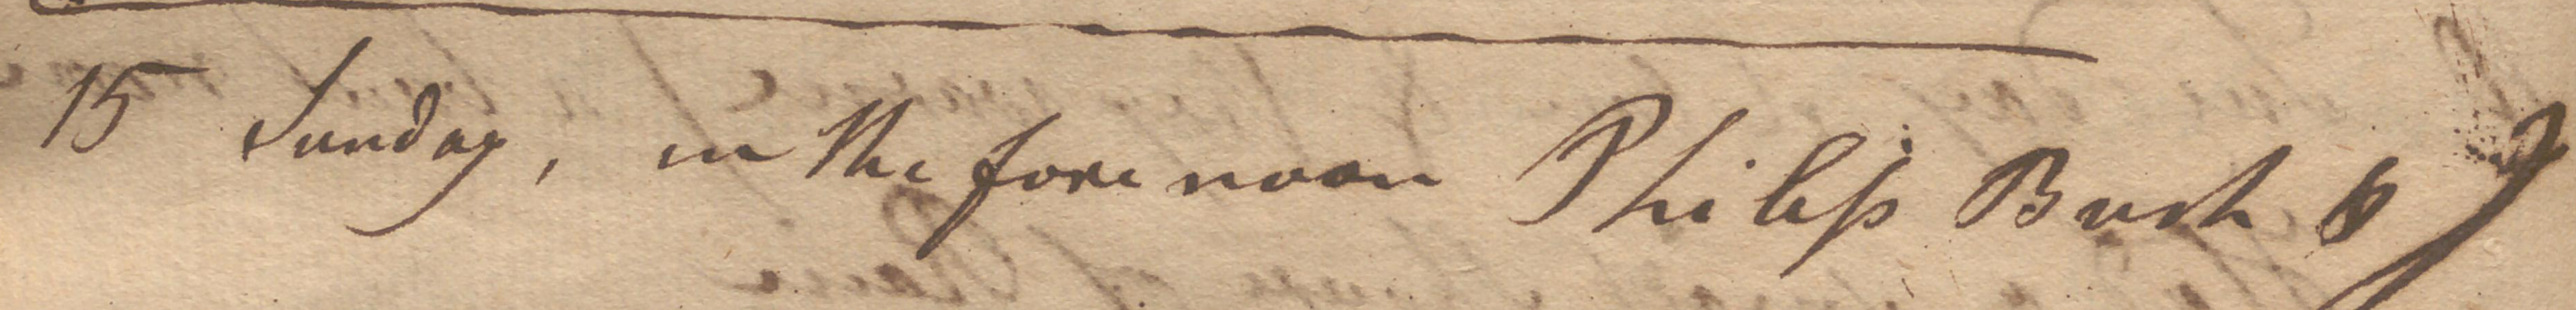15 Sunday, in the forenoon Philip Bush & I
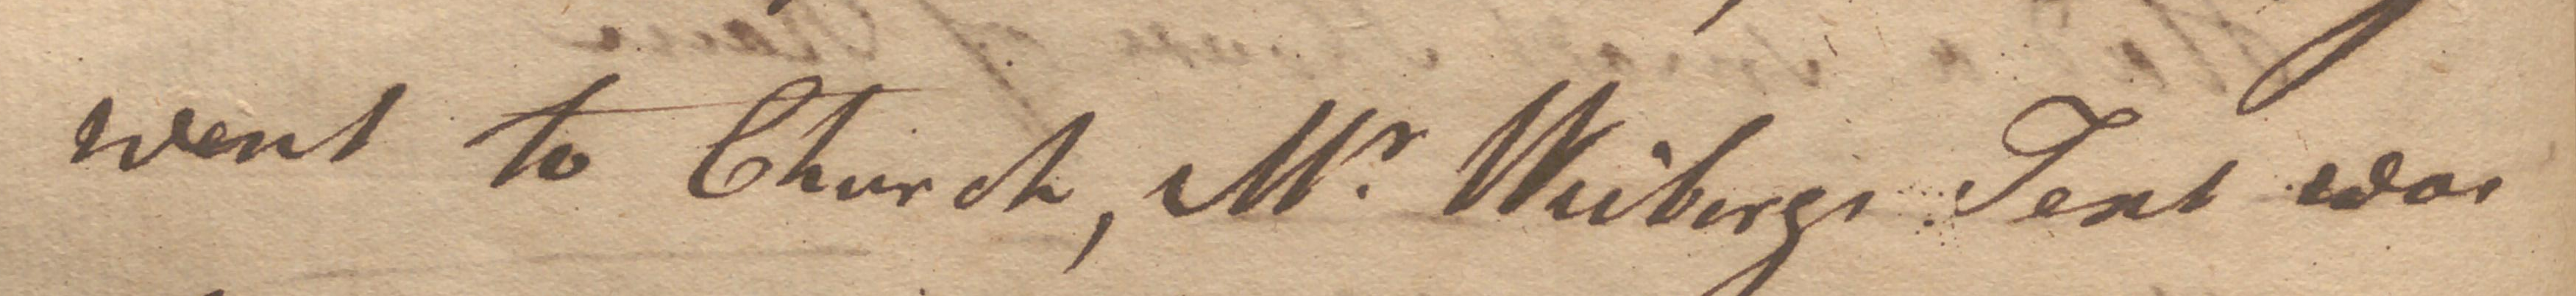went to Church, M^r. Weibergs Text was
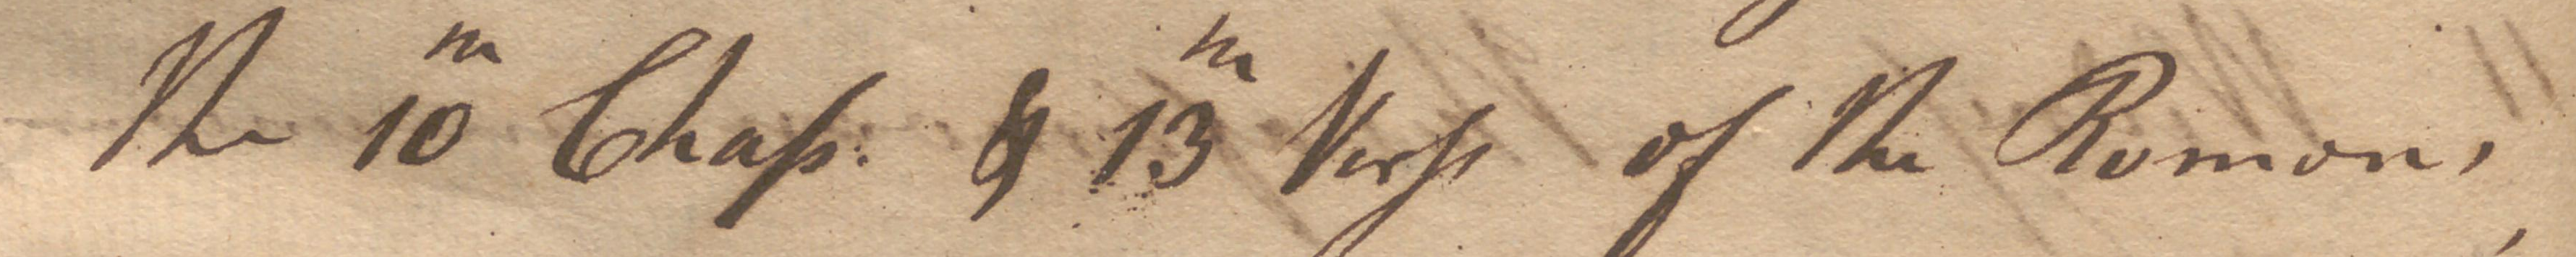the 10^th Chap. & 13^th Verss of the Romons
